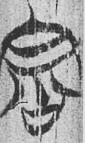舍（余）
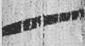一
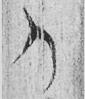人
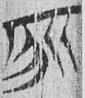所
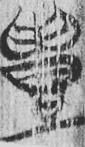豊
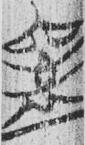寍（寧）
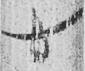心
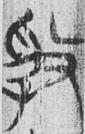○（緩）
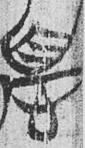○（憂）
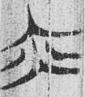亦
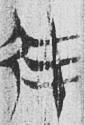隹（唯）
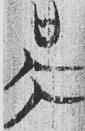吳
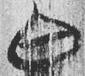白（伯）
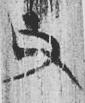父
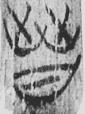晉
